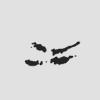二
